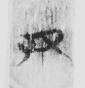四
